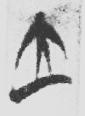立
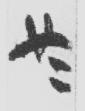廿=
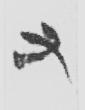又
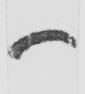一
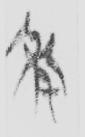年
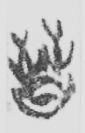晉
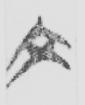文
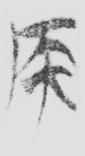侯
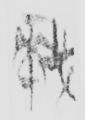{戈戈}
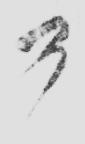乃
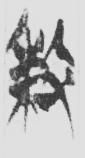殺
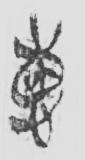惠
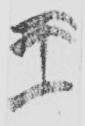王
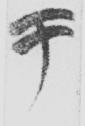于
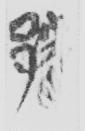{邑寽虎}
